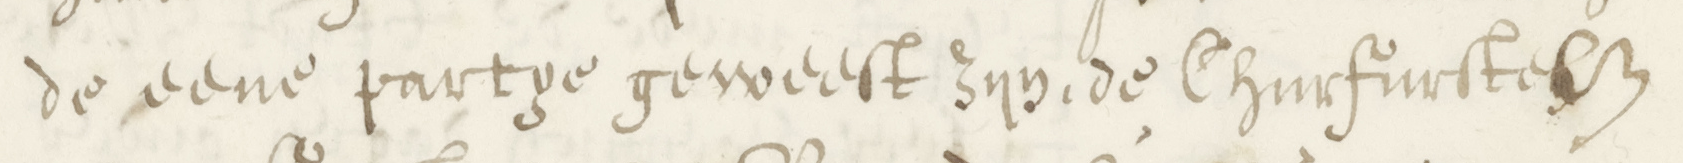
de eene partye geweest zyn, de Churfurstel
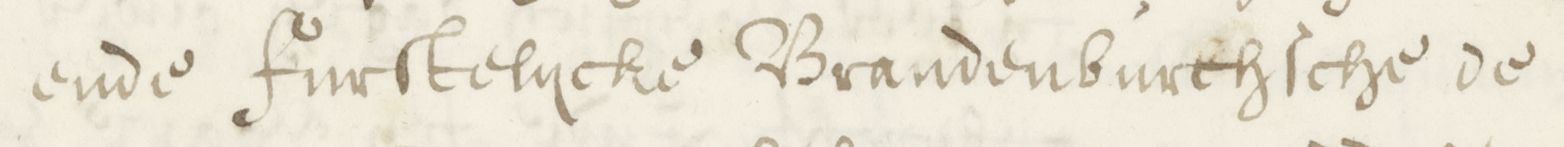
ende furstelycke Brandenburchsche de
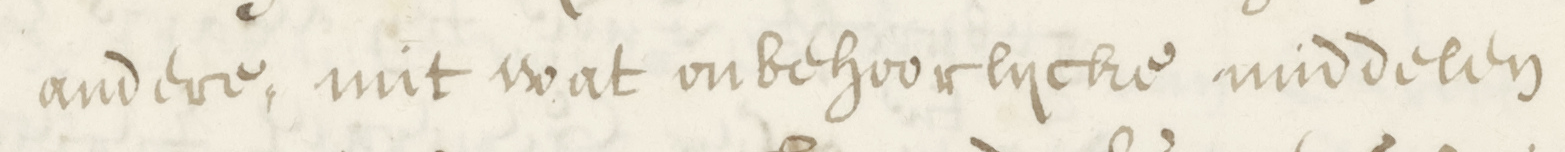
andere, mit wat onbehoorlycke middelen
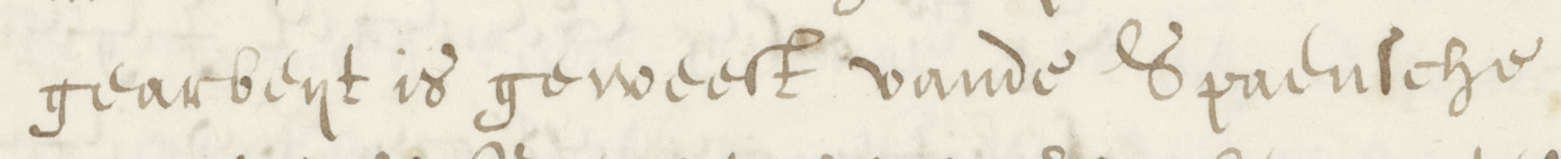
gearbeyt is geweest vande Spaensche
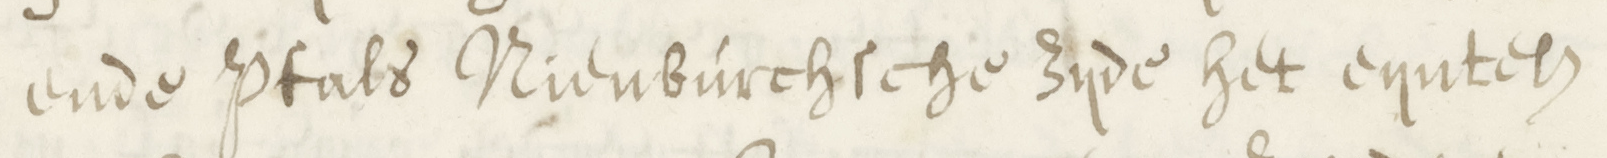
ende Pfals Nieuburchsche zyde het eyntel
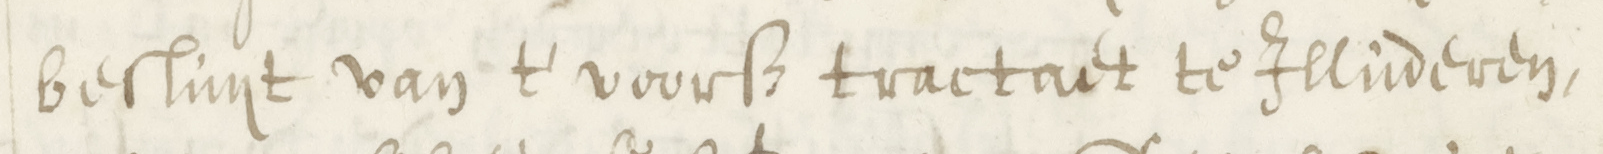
besluyt van 't voors tractaet te Illuderen
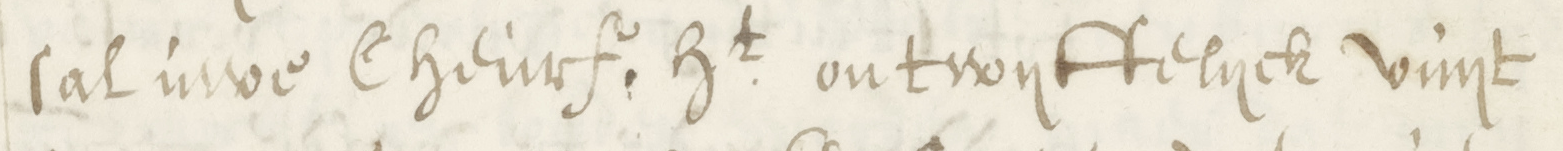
sal uwe Cheurf. Ht. ontwyffelyck vuyt
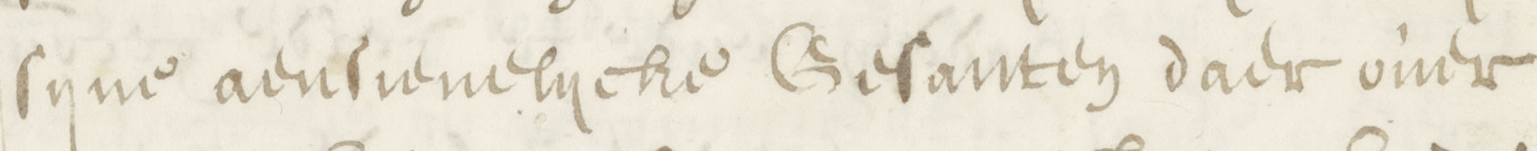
syne aensienelycke Gesanten daer ouer
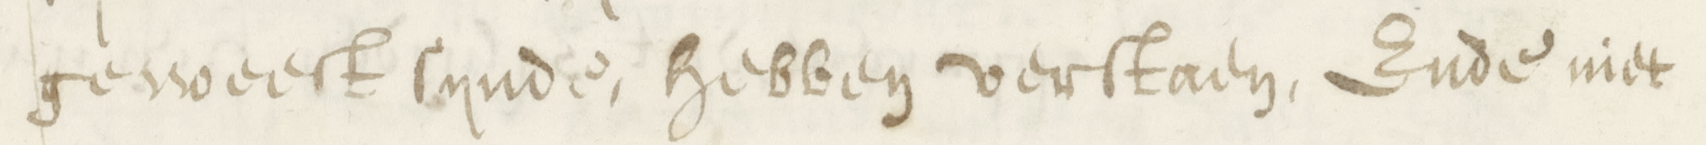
geweest synde, hebben verstaen. Ende niet
